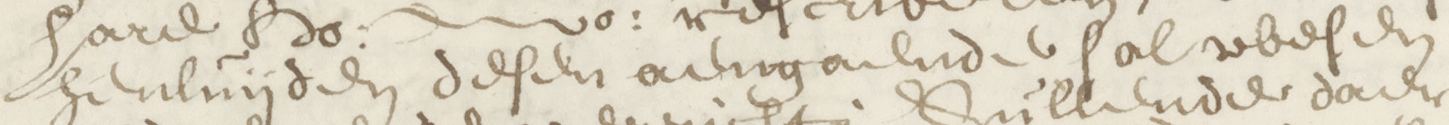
henluijden desen aengaende sal wesen
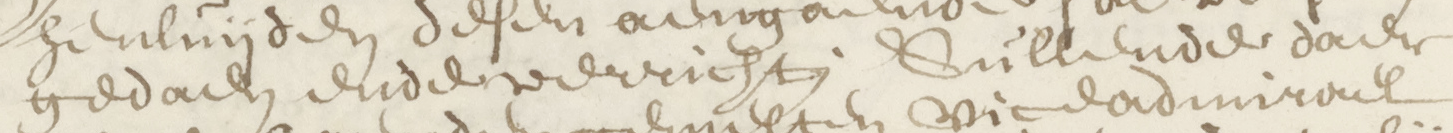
gedaen ende verricht; Sullende daer
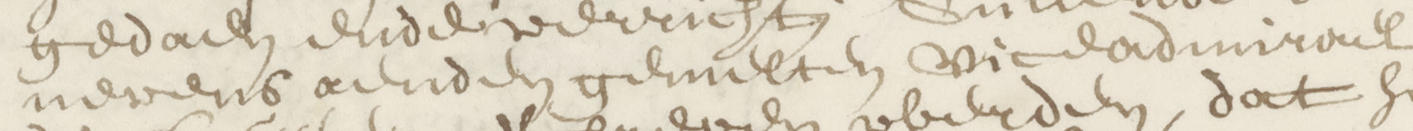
nevens aenden gemelten Viceadmirael
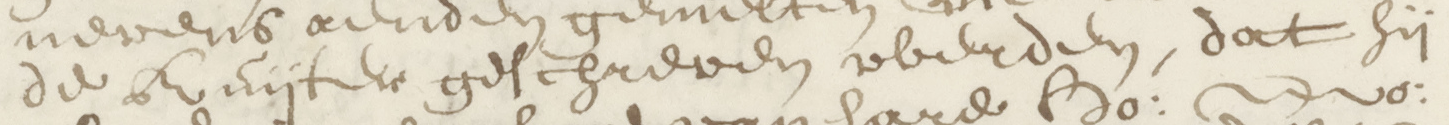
de Ruijter geschreven werden, dat hij
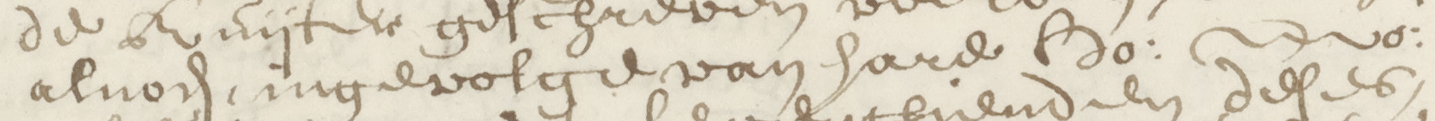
alnoch, ingevolge van hare Ho:Mo:
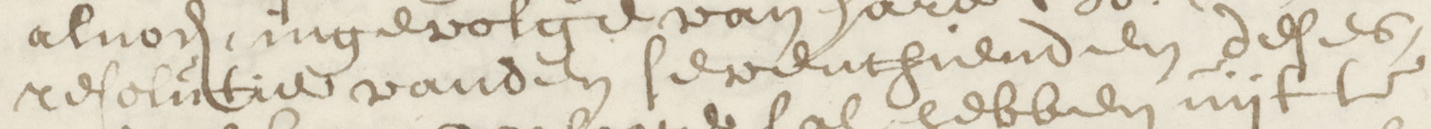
resolutie vanden seventhienden deses,
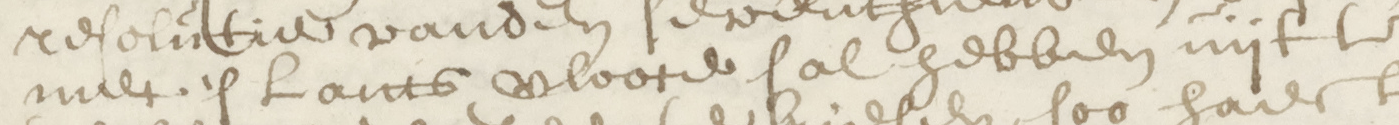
met 's Lants vloote sal hebben uijt te
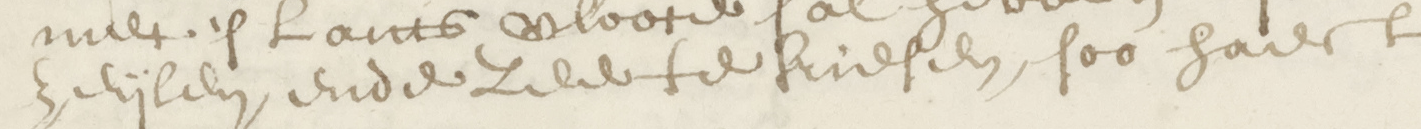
zeijlen, ende Zee te kiesen, soo haest
